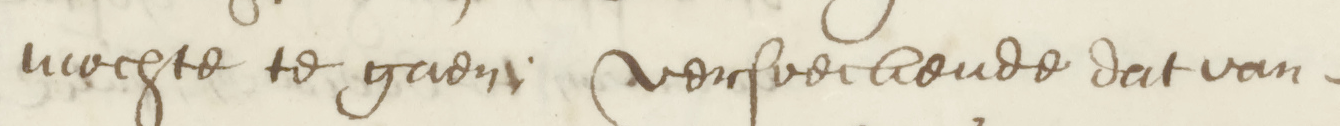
mochte te gaen, versoeckende dat van
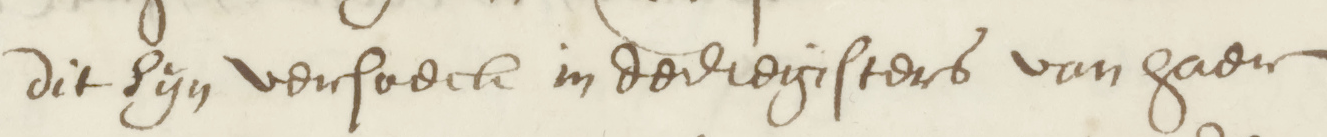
dit sijn versoeck in de registers van haer
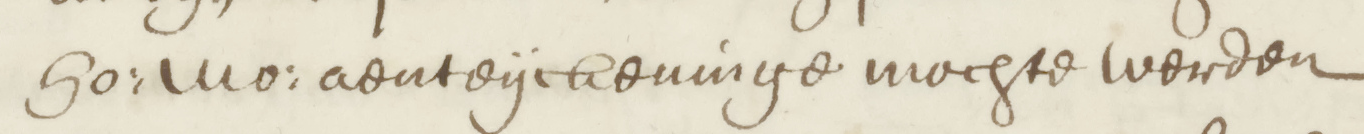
ho:mo: aenteijckeninge mochte werden
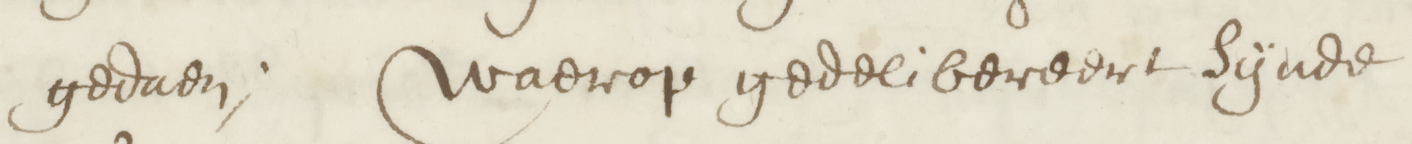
gedaen; Waerop gedelibereert sijnde
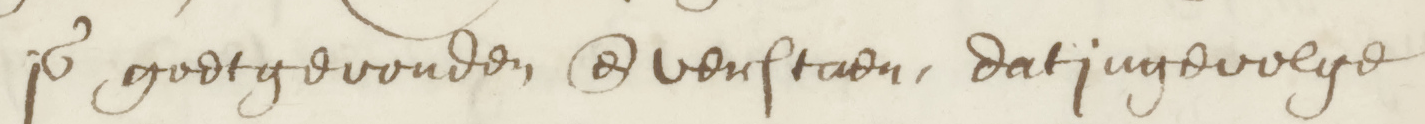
is goetgevonden & verstaen, dat ingevolge
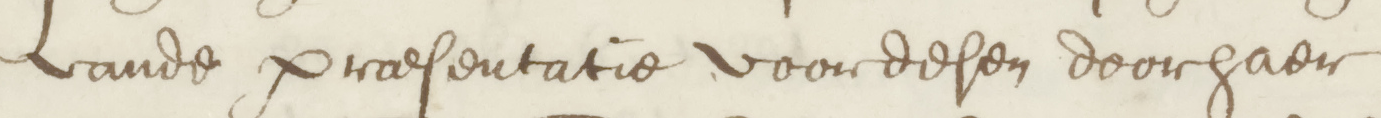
vande præsentatie voordesen door haer
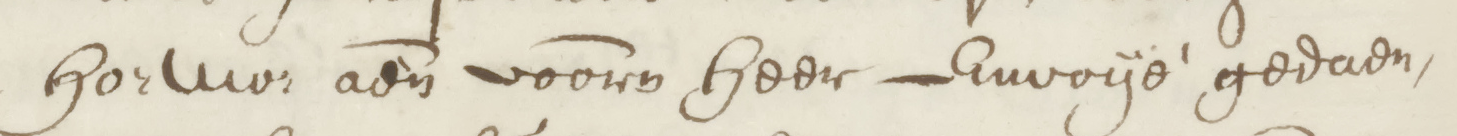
ho:mo: aen voorn heer Envoijé gedaen,
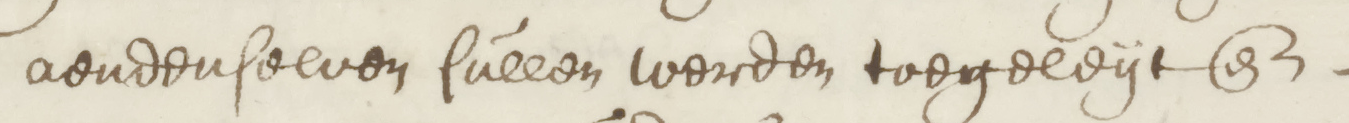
aen denselven sullen werden toegeleijt &
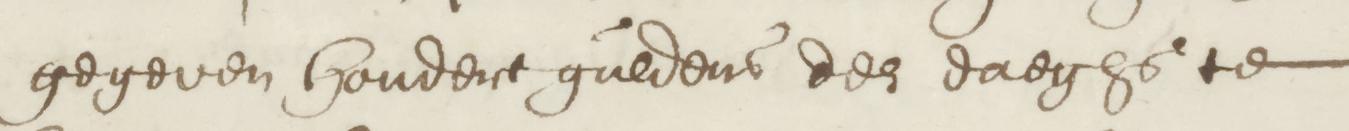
gegeven hondert guldens des daeghs te
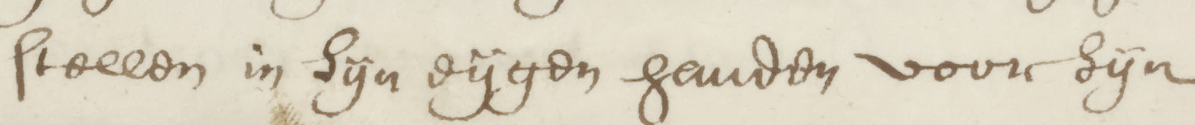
stellen in sijn eijgen handen voor sijn
